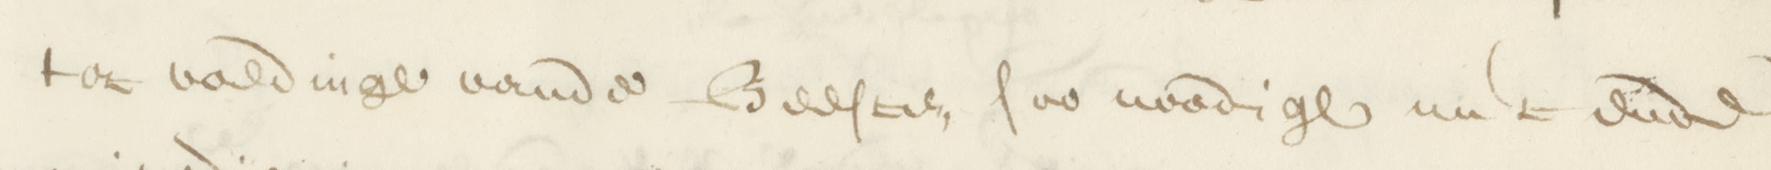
tot voedinge vande Beesten soo noodigh nut ende
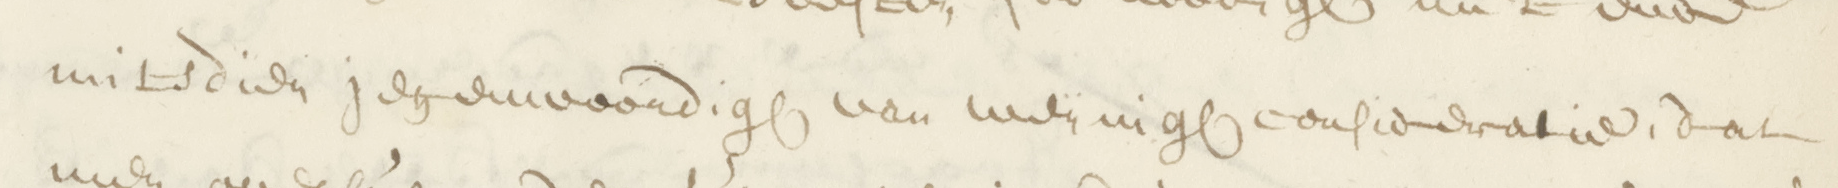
mitsdien jegenwoordigh van weijnigh consideratie, dat
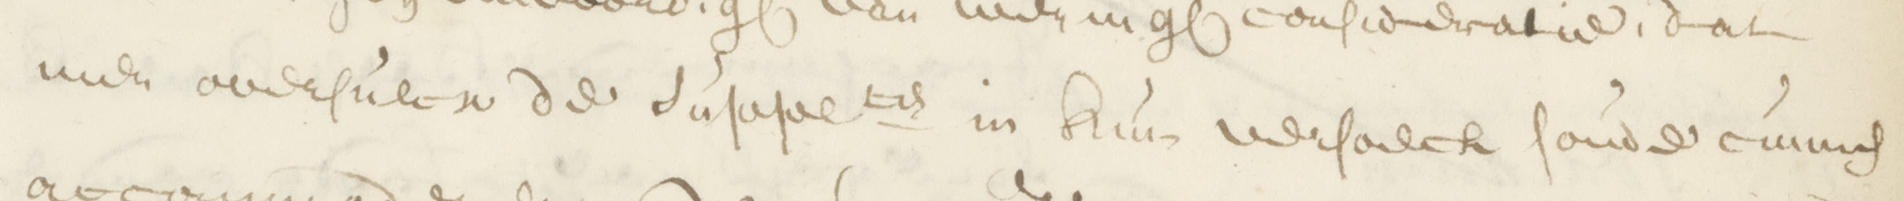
men oversulcx de supplten in hun versoeck soude cunnen
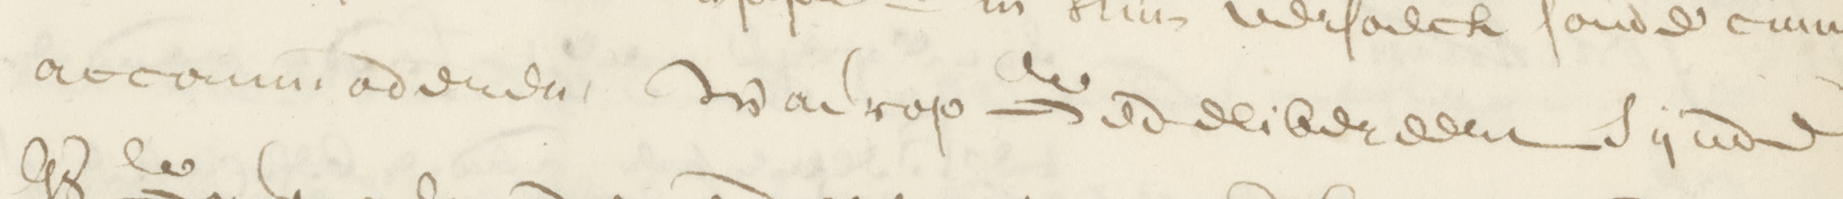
accomoderen. Waerop Gedelibereert sijnde
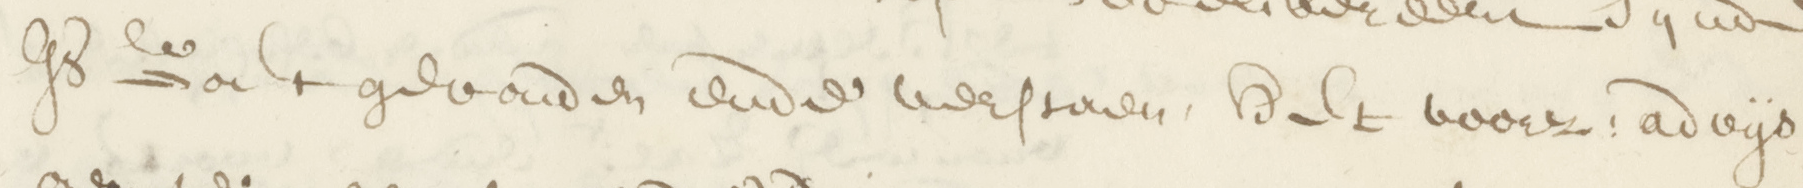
Is Goet gevonden ende verstaen het voorz: advijs
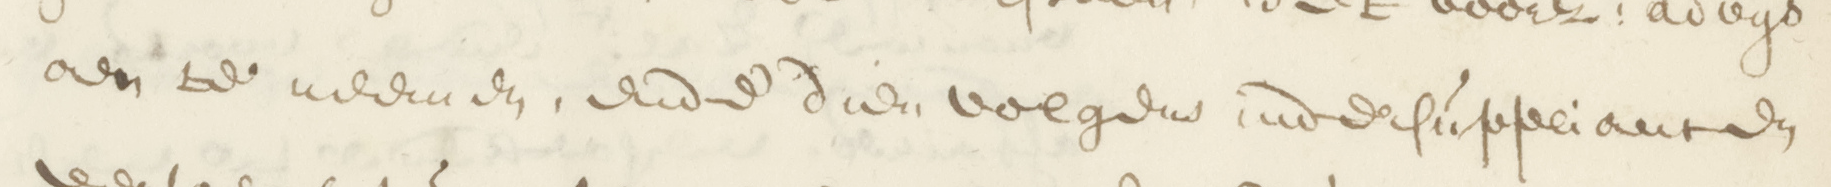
aen te neemen, ende dien volgens inde supplianten
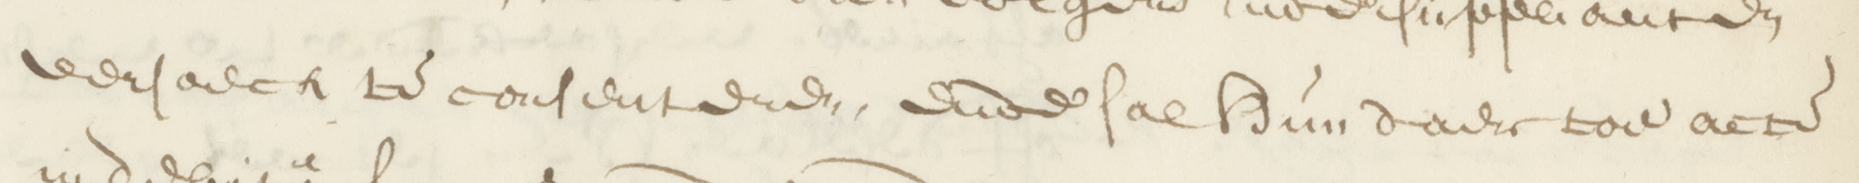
versoeck te consenteren, ende sal hun daer toe acte
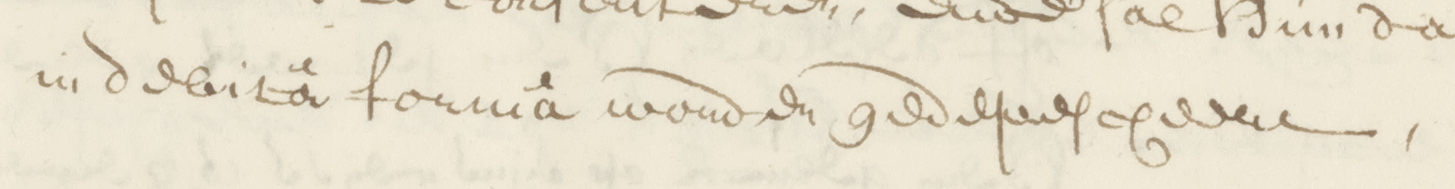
in debita forma worden gedepescheert.
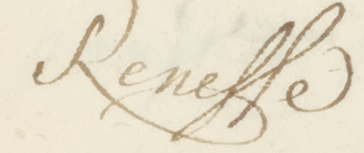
Renesse
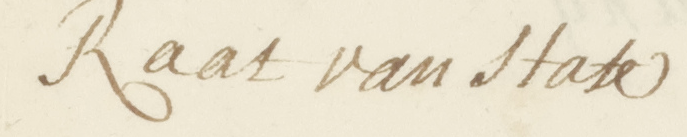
Raat van State
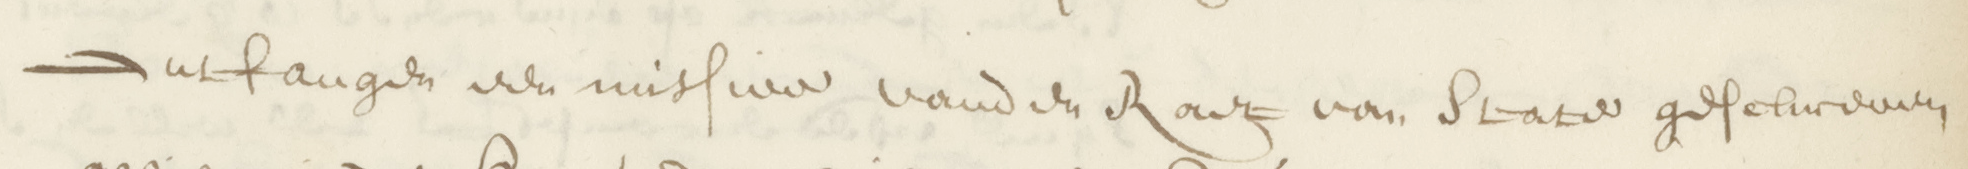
Ontfangen een missive vanden Raet van State geschreven
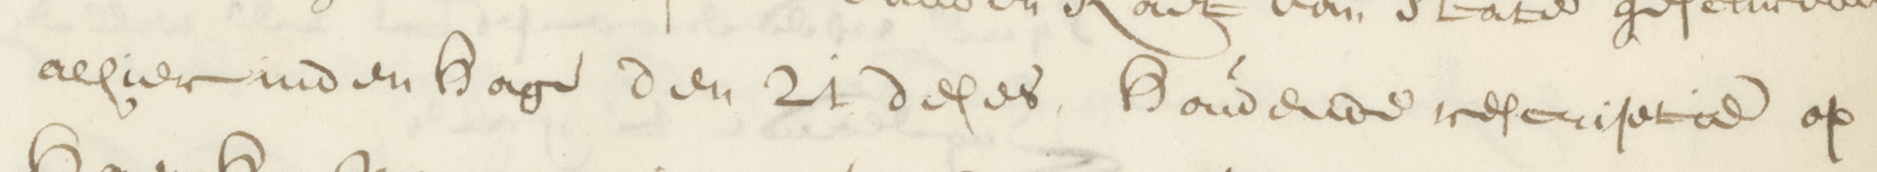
alhier in den Hage den 21 deses, Houdende rescriptie op
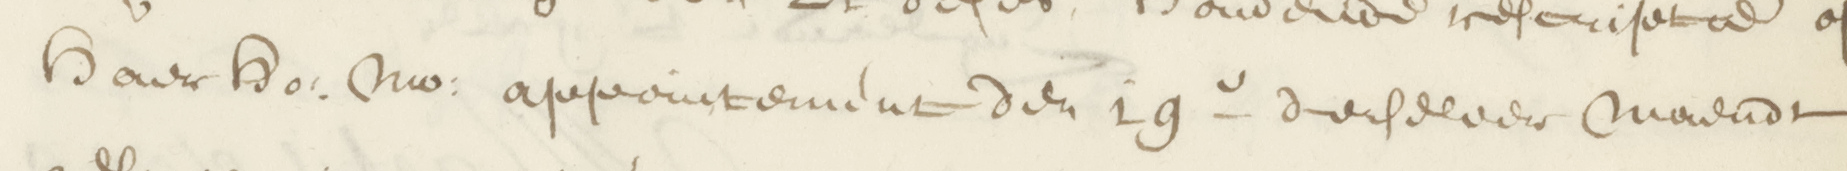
haer Ho:Mo: appointement den 19e derselven maendt
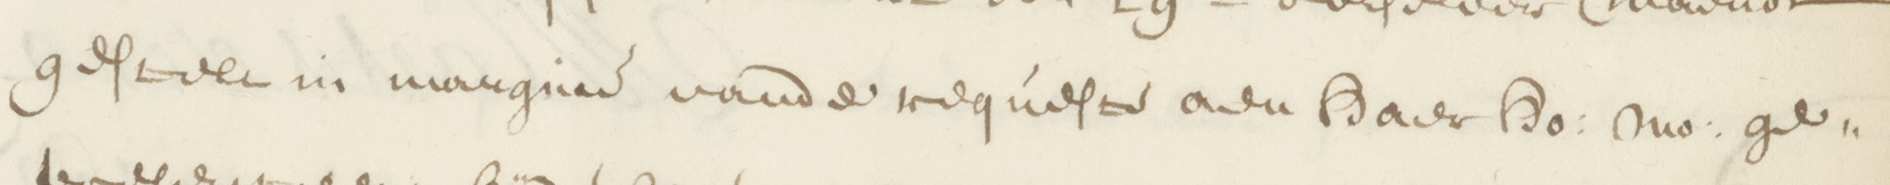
gestelt in margine vande requestes aen haer Ho:Mo: ge„
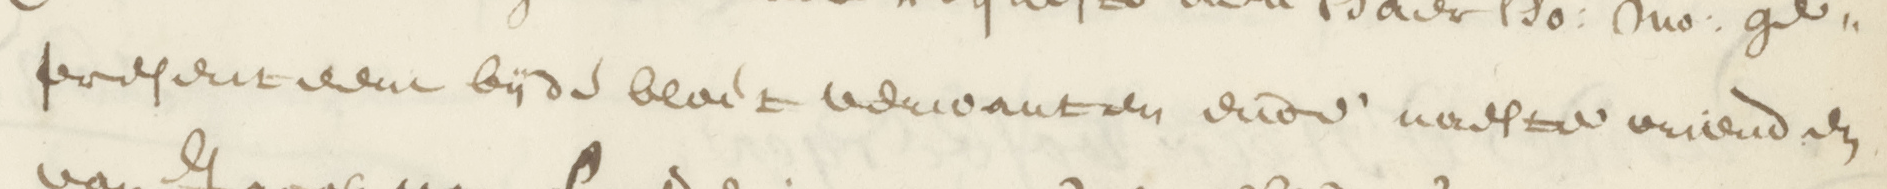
presenteert bijde bloetverwanten ende naeste vrienden
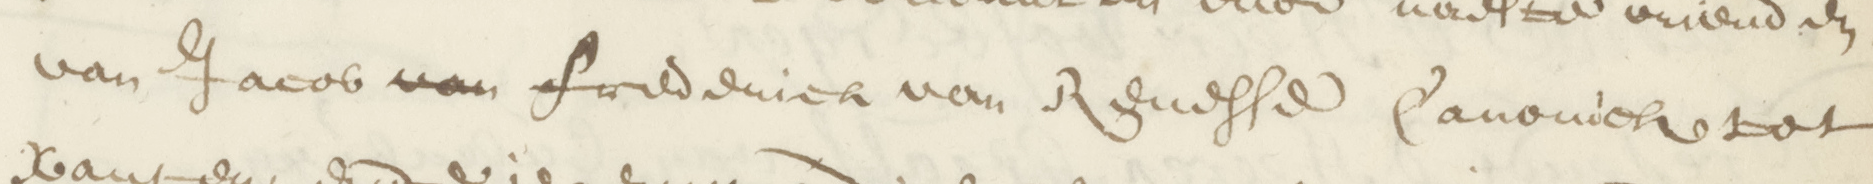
van Jacob van Frederick van Renesse Canonick tot
